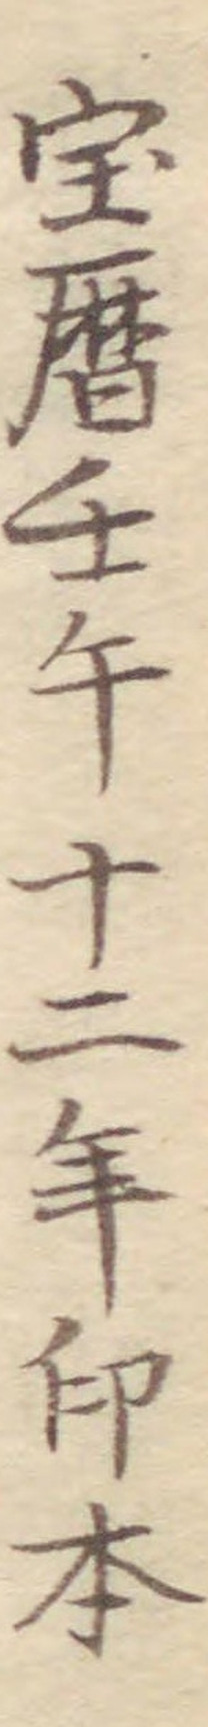宝暦壬午十二年印本
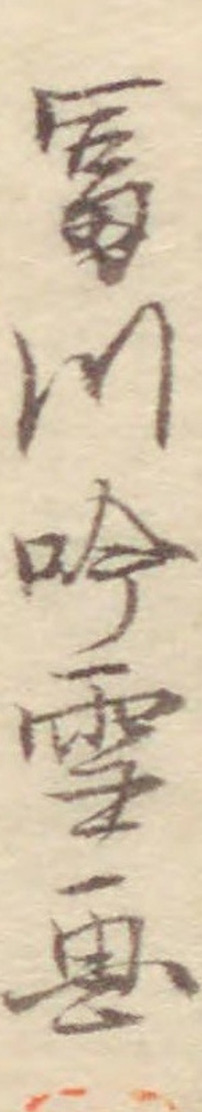冨川吟雪画
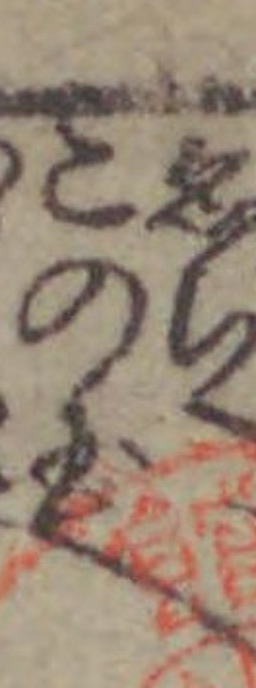この国
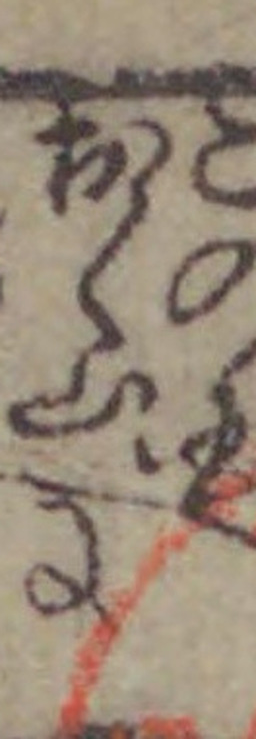おく山に
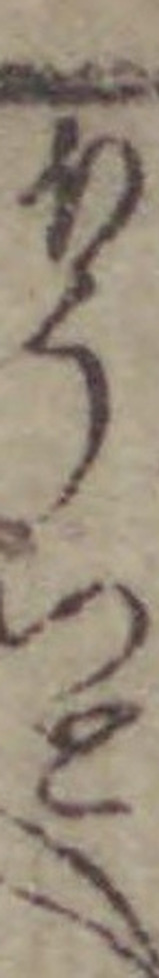ほういと
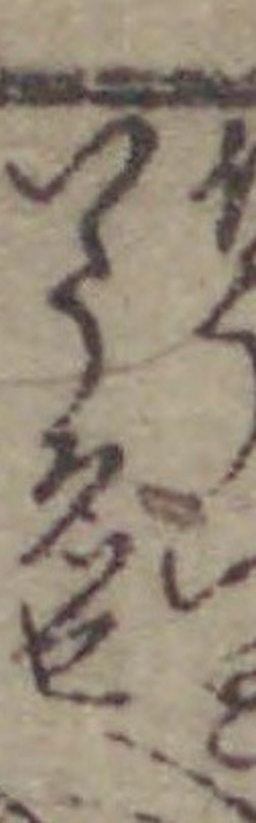いうゑせ
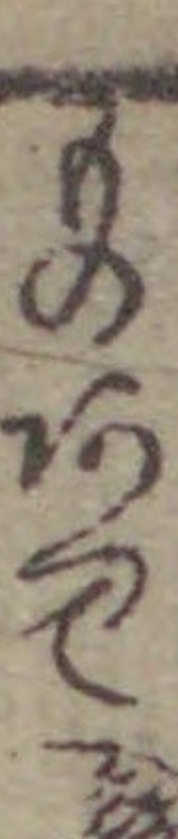ものあつて
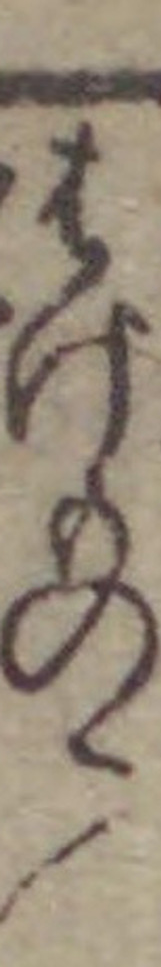はけものゝ
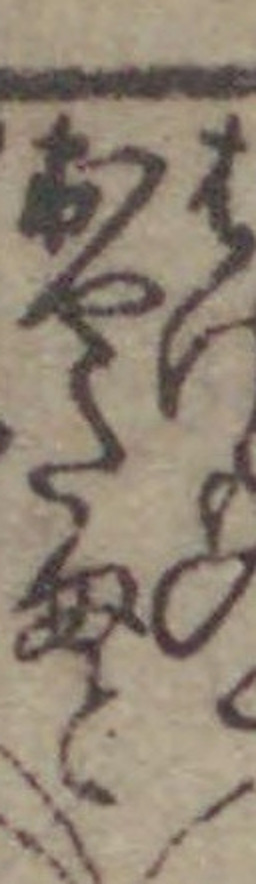おやたまと
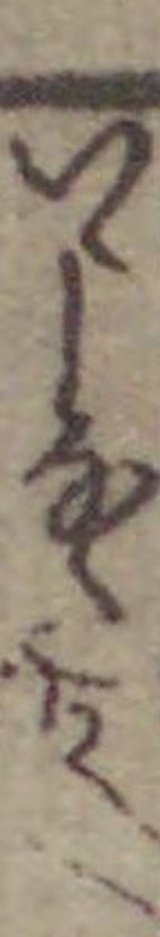いゝしなたか
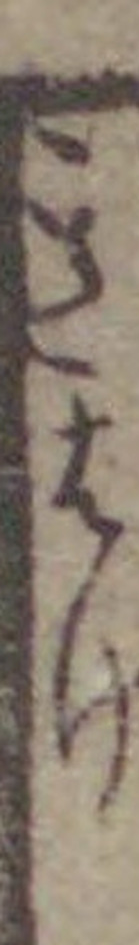きはけ
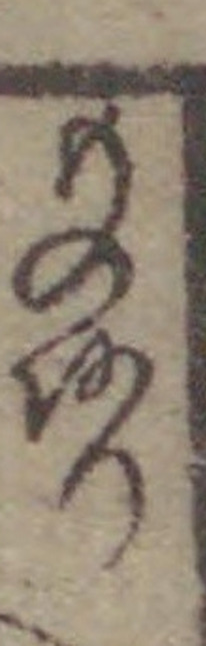ものあり
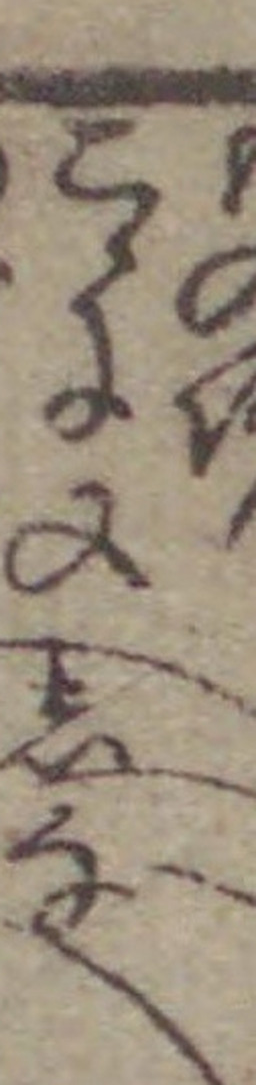こゝに又しな
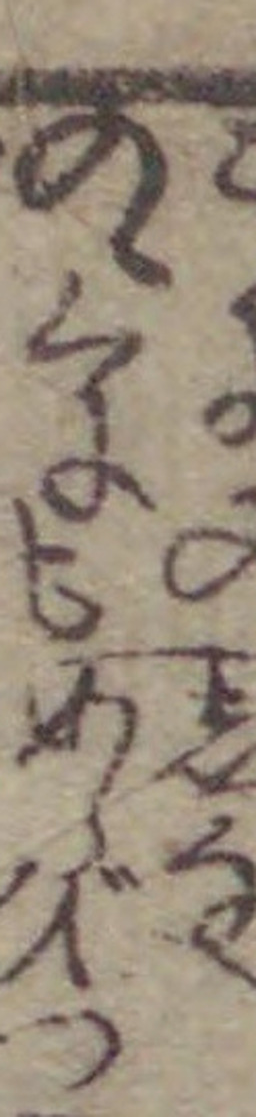のゝくにもめしびつ
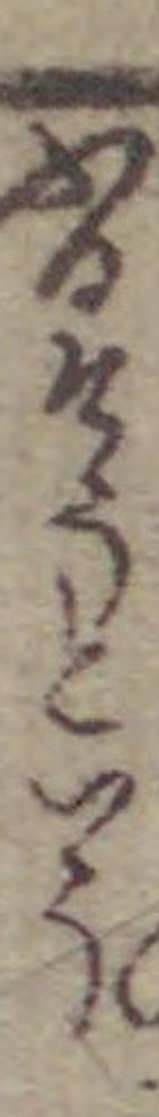ふるそうという
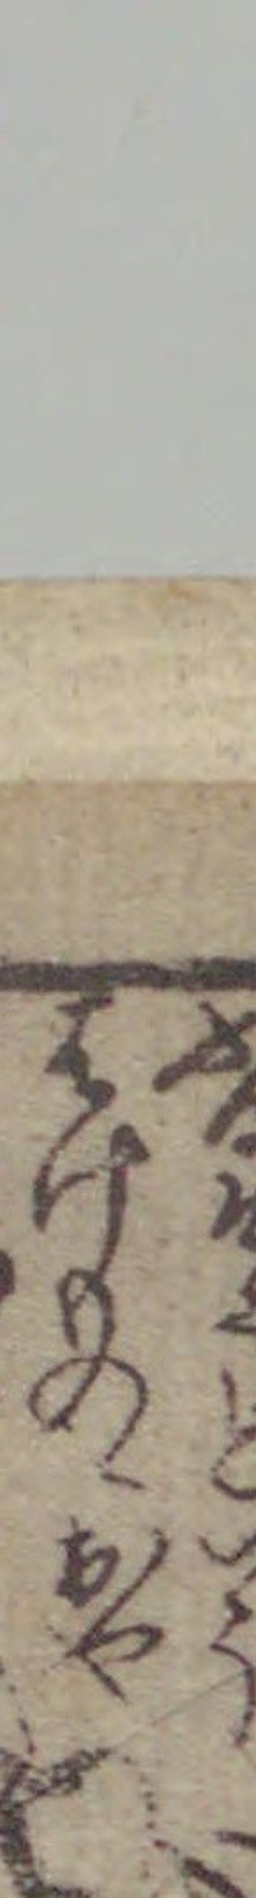はけものゝおや
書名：妖相生の盃 2巻
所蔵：国立国会図書館 National Diet Library, JAPAN
